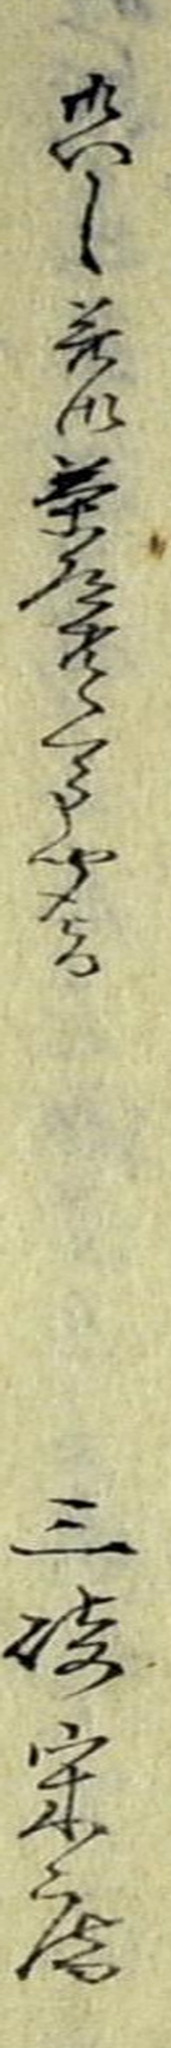御いし并御茶道共へ可申聞旨三崎宋庵
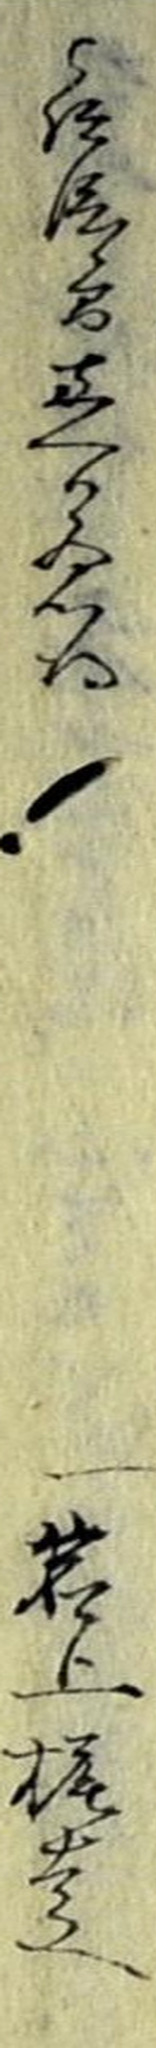被仰渡候間両人ハ為心得岩上梶大夫
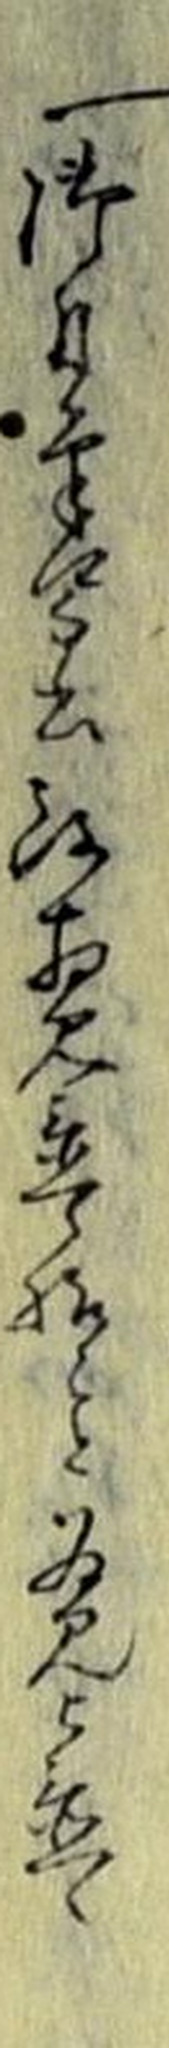御自筆写書致拝見置候様ニと為見被置候
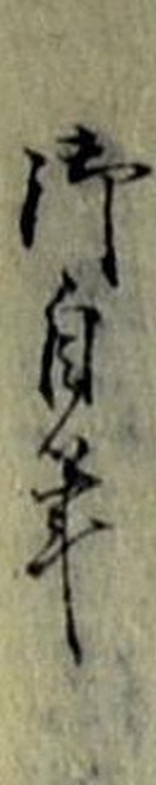御自筆

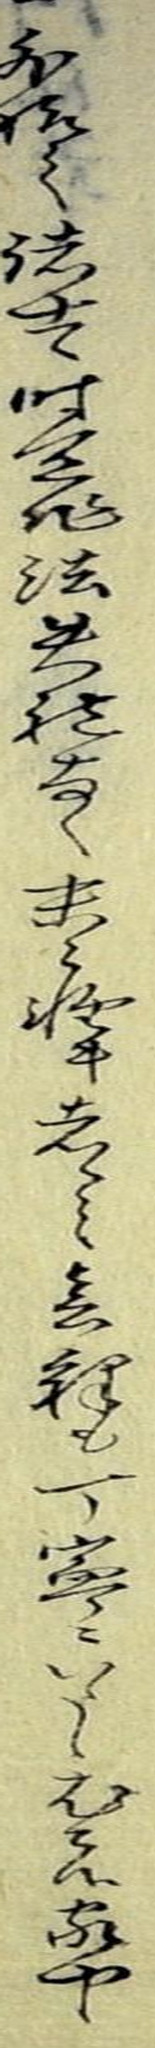〇外様之諸士へ時宜作法失礼なく末々軽キ者へ之会釈も丁寧ニいたし尤ニ候家中
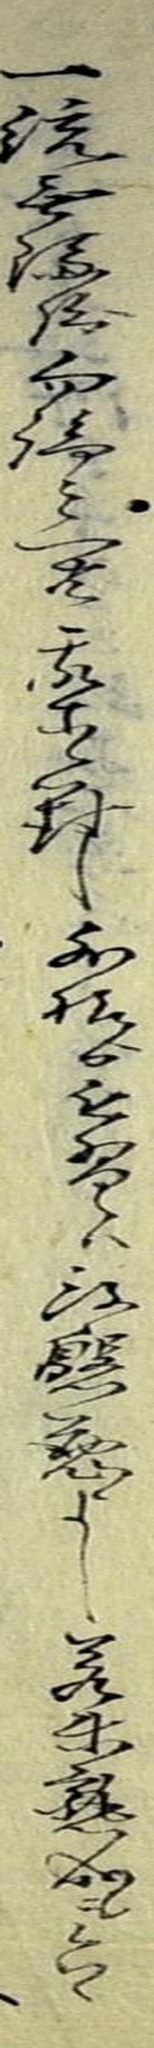一統無隔儀勿論ニ候へ共我等へ対し外様ゟ近習ヘハ致慇懃よし若未熟成も候ハヽ
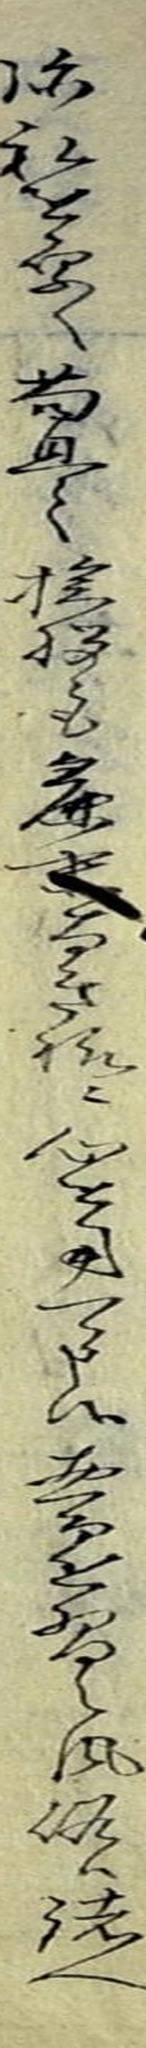弥私を厚く苟且之挨拶ニも麁末なき様ニ心を用可申候惣而近習之風俗ハ諸人
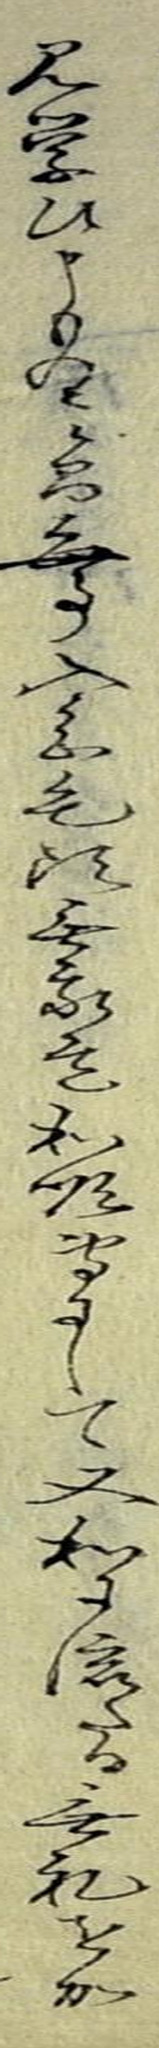見学ひ申ものニ候間毎事入念毛頭無我意和順専にして又和に流たる無礼を加
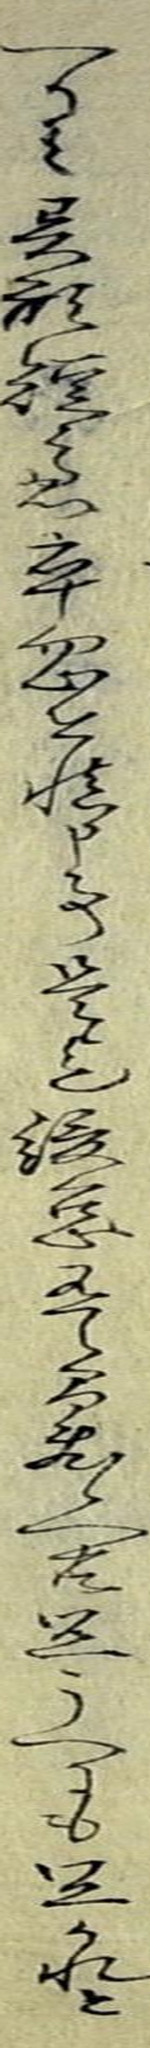へりみ異形短慮卒忽を慎申事是迄緩怠有之間敷候ヘ共宜うへにも宜かれと
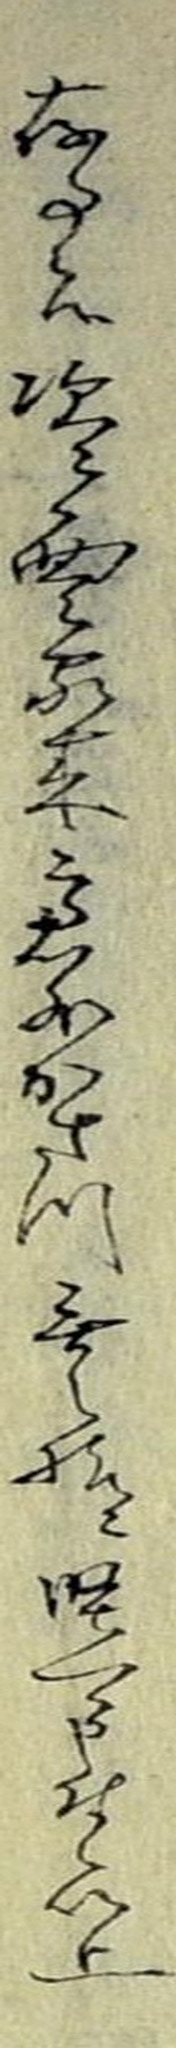存事ニ候次ニ面々家来慮外かさつ無之様ニ堅可申付候以上
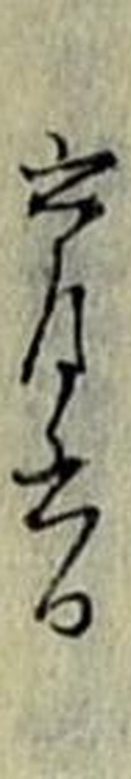六月六日
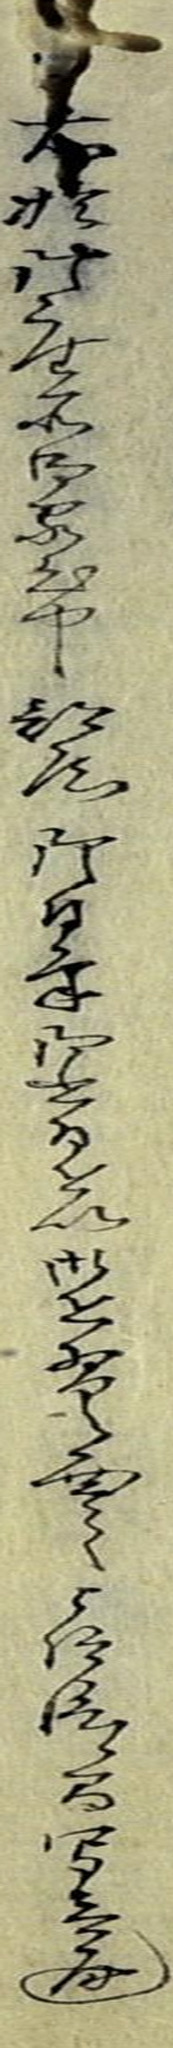〇右於御座所御家老中部屋御自筆御書付を以御近習之面々へ被仰渡候間写壱通
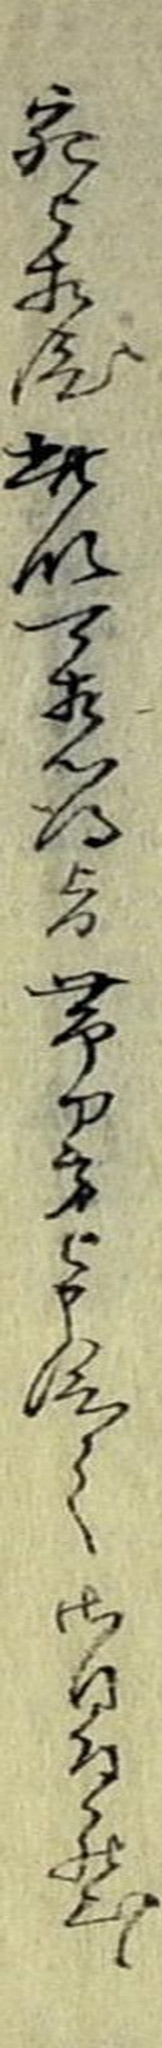宛被相渡此段可相心得旨帯刀方被申渡之御目付罷出候
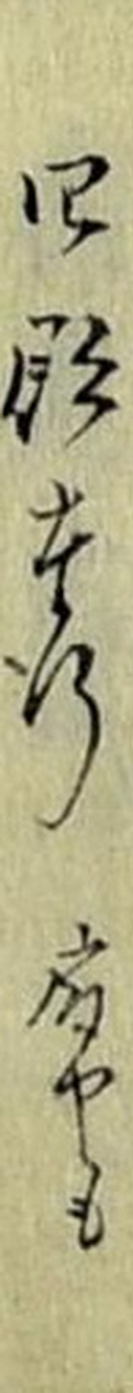四郡奉行府中へも
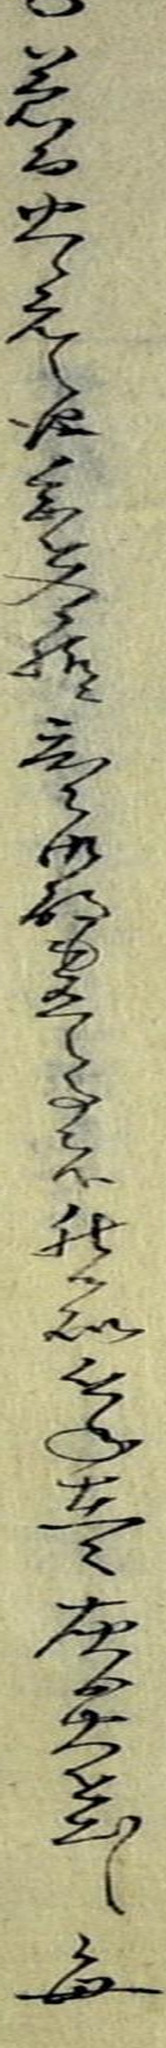〇兼而火之元之儀念を入候様ニ度々御触も有之事ニ候然ル処近年在々灰ゟ火を出し毎
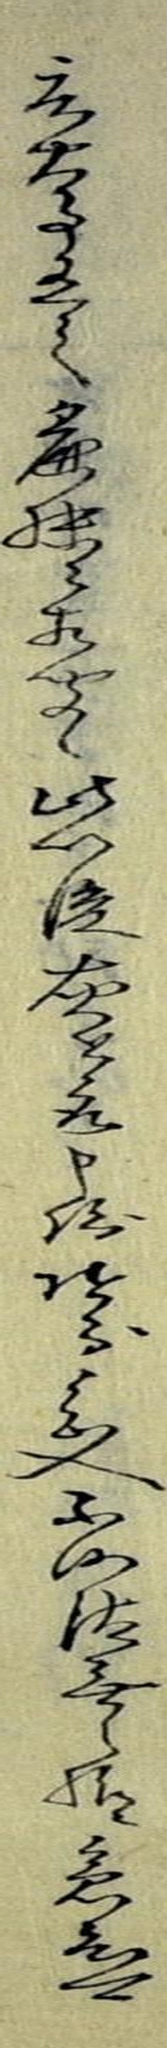度火事有之麁抹ニ相聞候此以後灰を取申儀随分念入不沙汰無之様ニ急度可
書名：命令之部 一
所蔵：福井県文書館 Fukui Prefectural Archives
